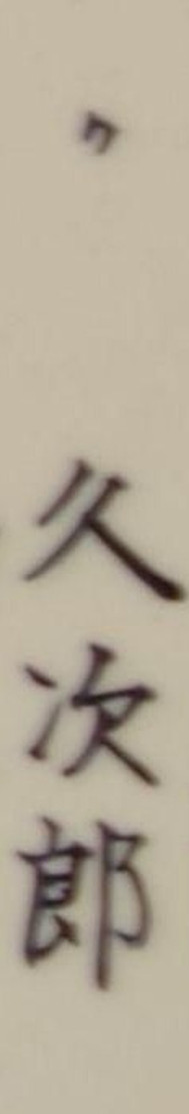久次郎
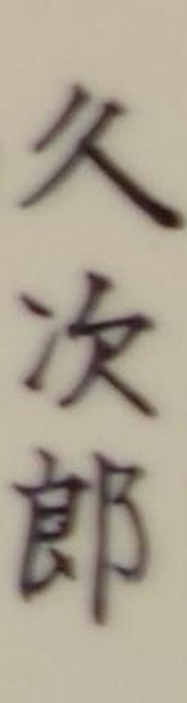久次郎
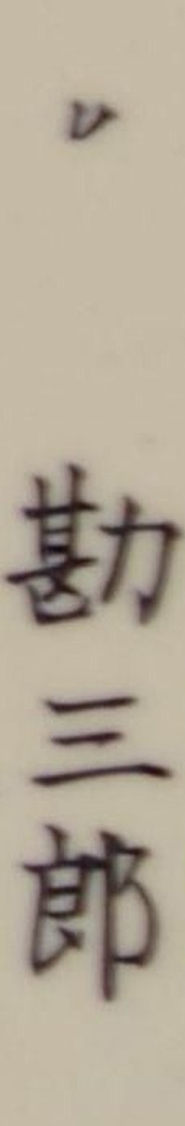勘三郎
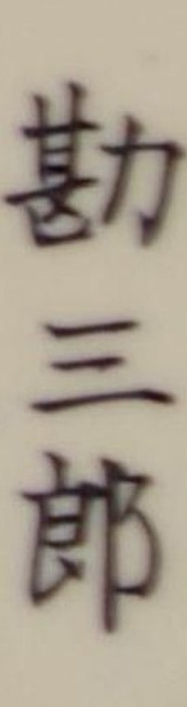勘三郎
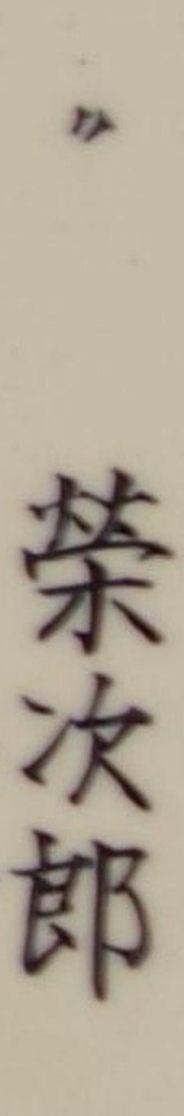榮次郎
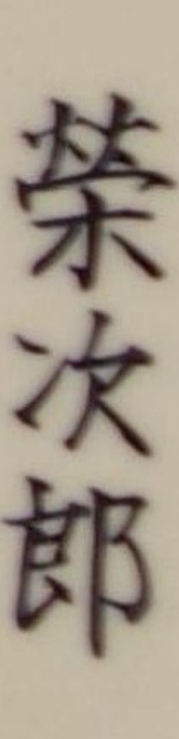久次郎
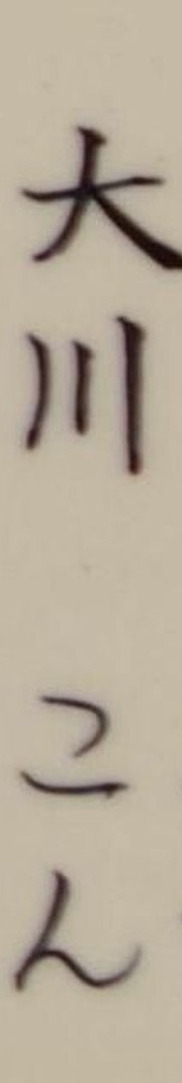大川こん
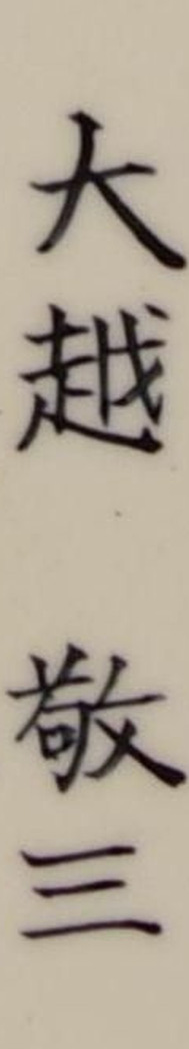大越敬三
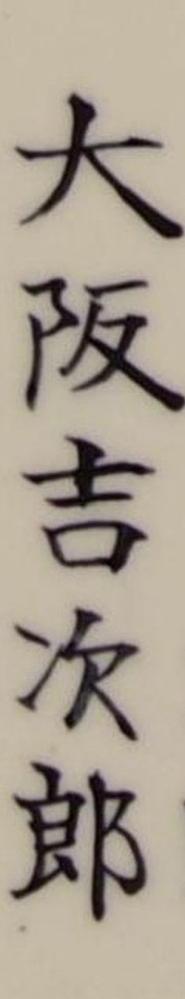大阪吉次郎
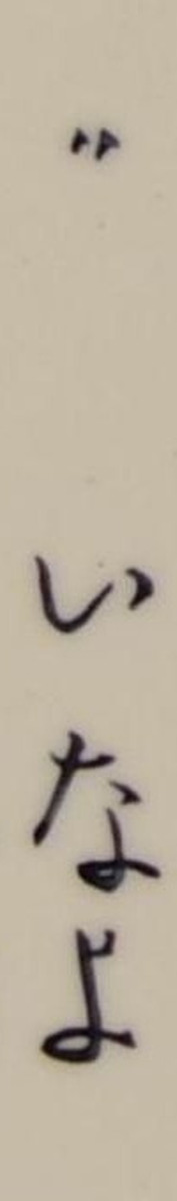いなよ
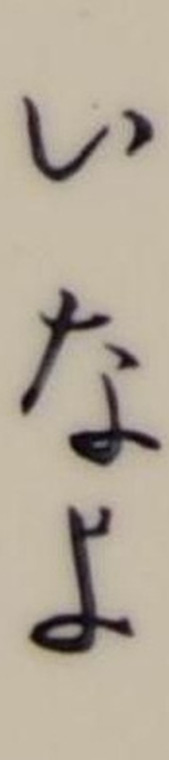いなよ
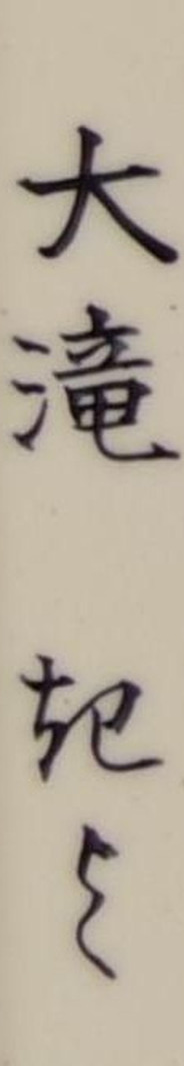大滝きよ

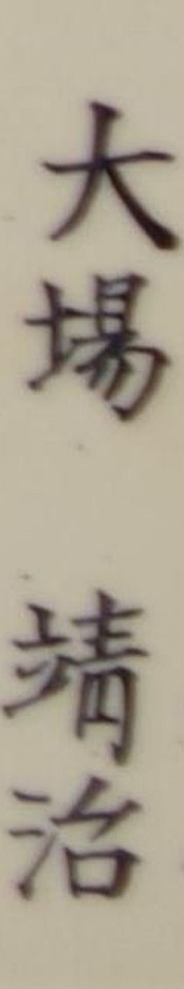大場靖治
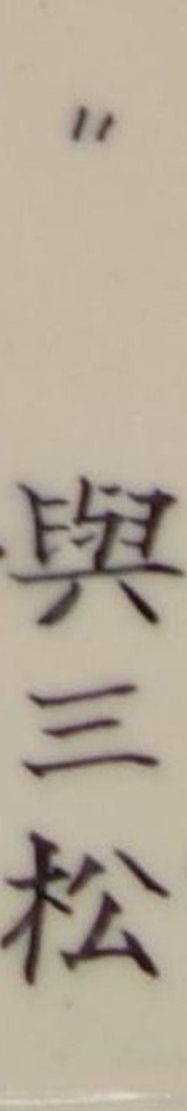與三松
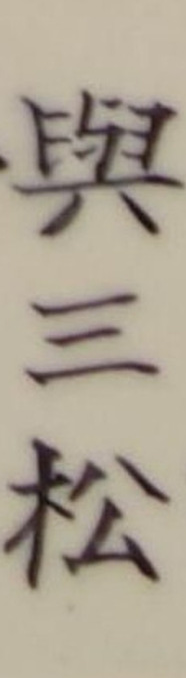與三松
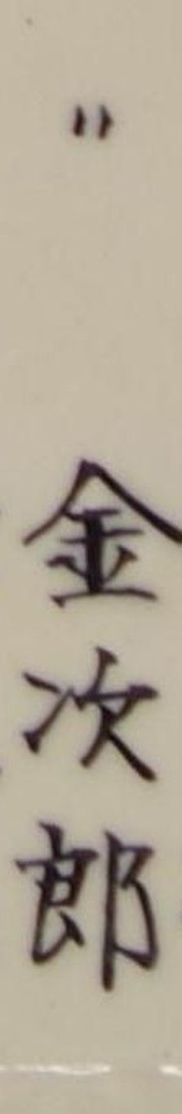金次郎
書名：M~S
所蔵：高野山金剛峯寺
